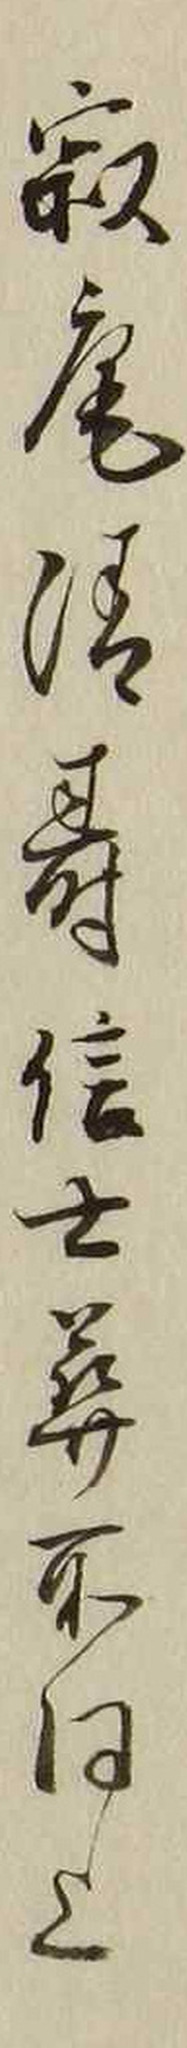寂？清寿信士葬所同上
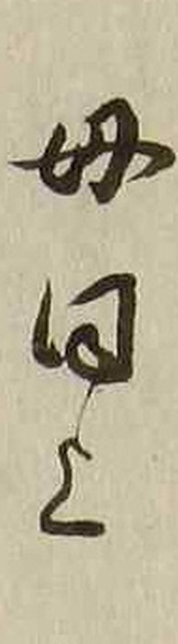母同上
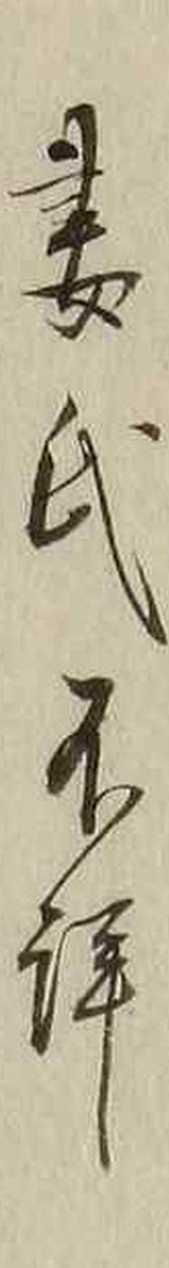母氏不詳
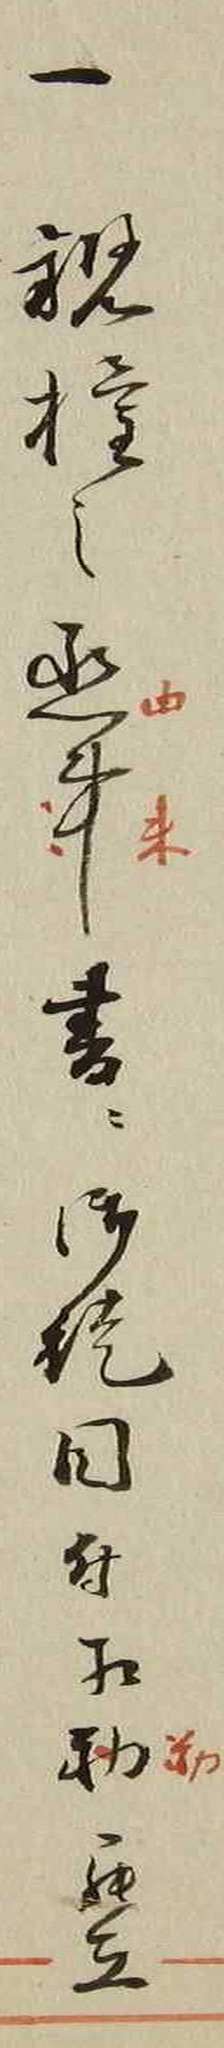一親権之丞事書に御徒目付相勤罷在
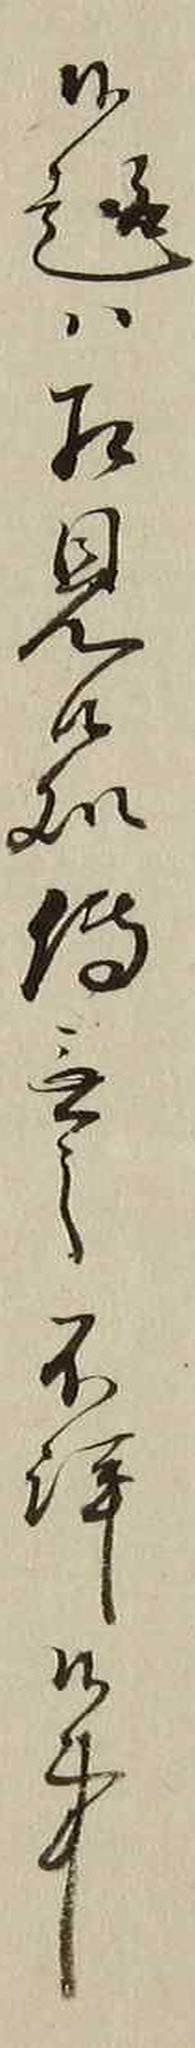候趣は相見候処伝無之不詳候事
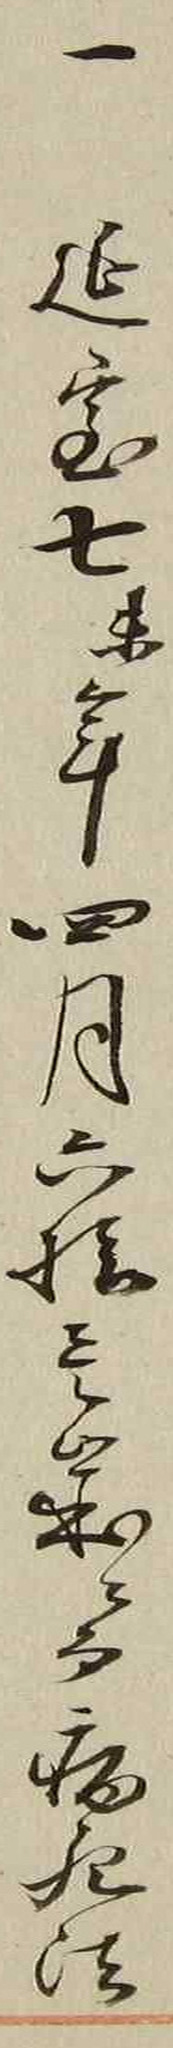一延宝七未年四月六十一歳にて病死法
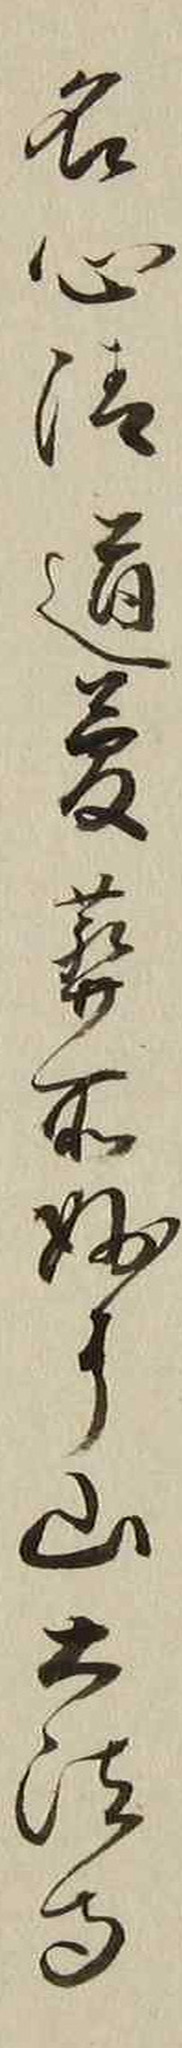名心清道慶葬所妙了山大宝寺
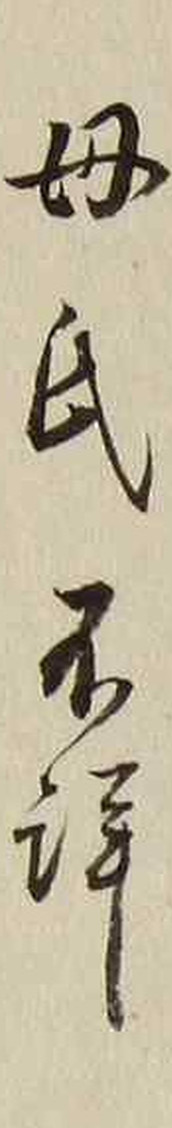母氏不詳
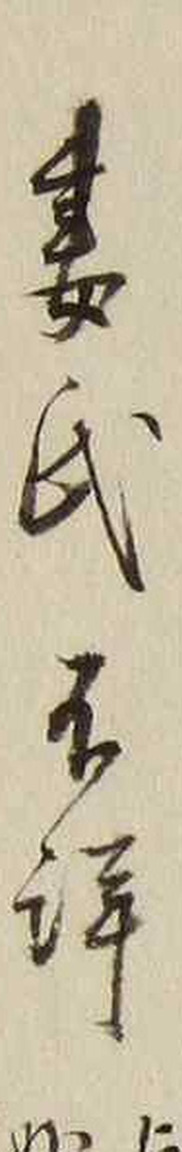母氏不詳

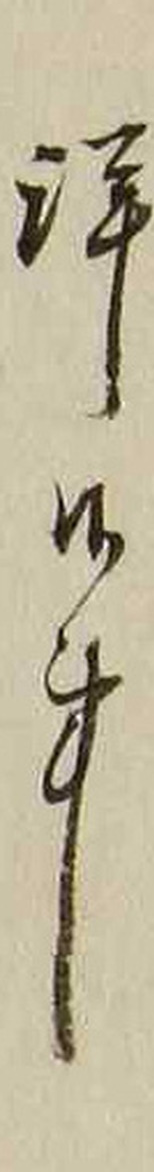詳候事
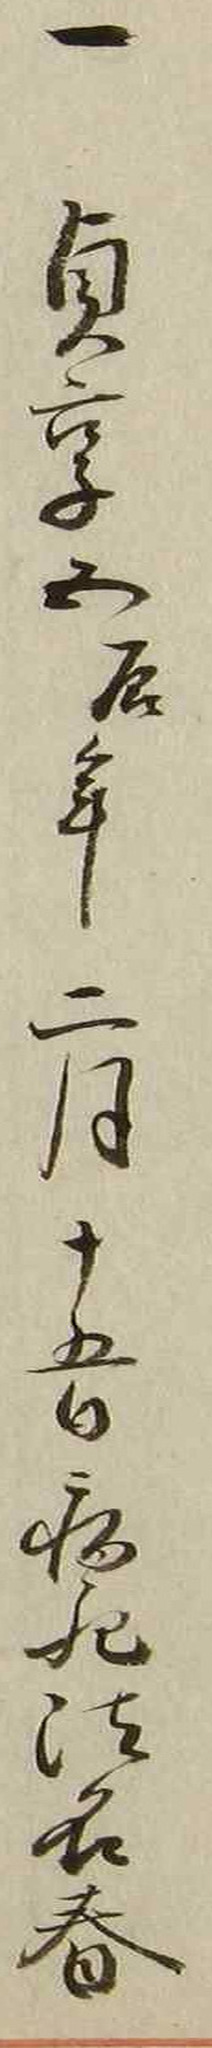一貞享五辰年二月十五日病死法名春
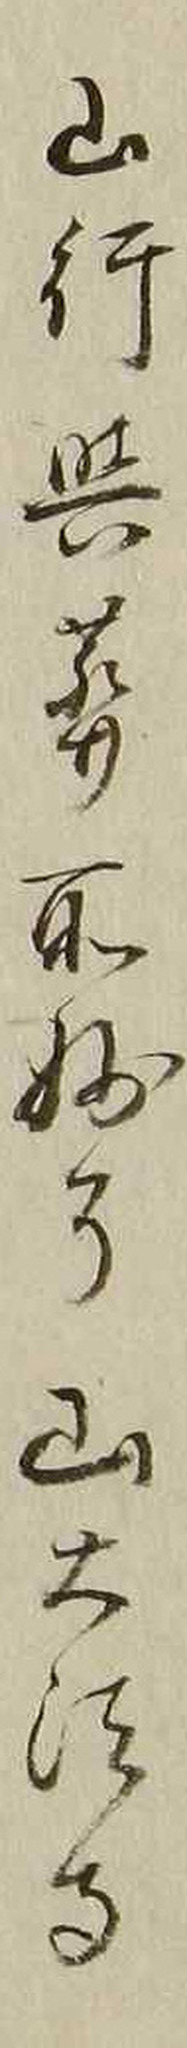山行興葬所妙了山大宝寺
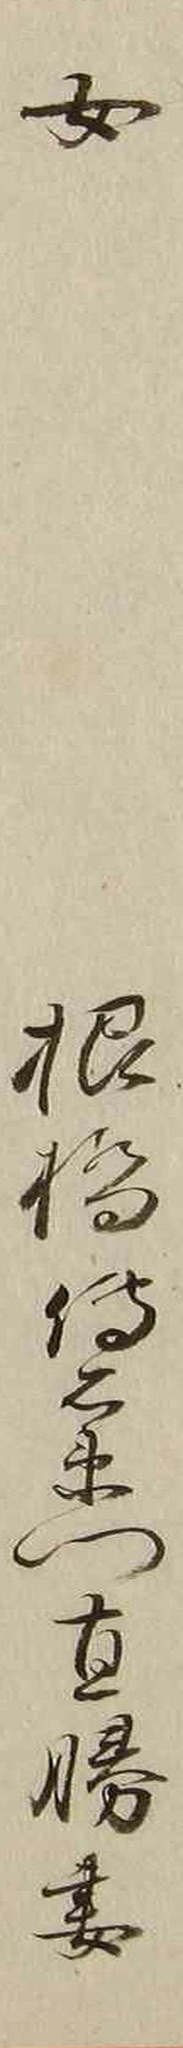女根橋伝右衛門直勝妻
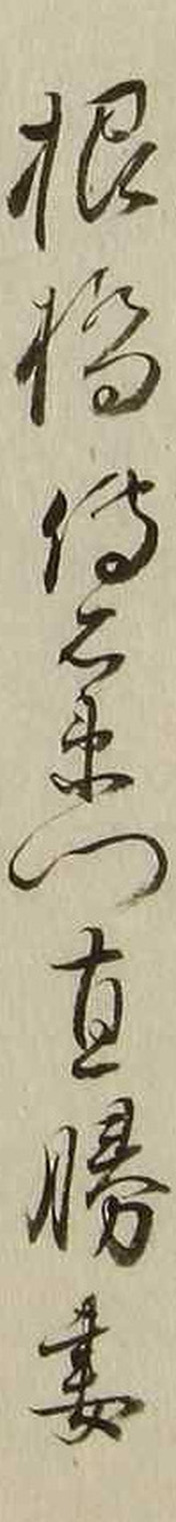女根橋伝右衛門直勝妻
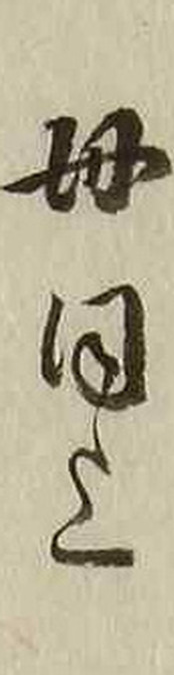母同上
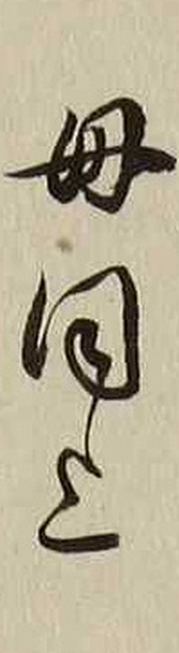母同上
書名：諸士系譜　巻之170　な之部12
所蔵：会津若松市立会津図書館
